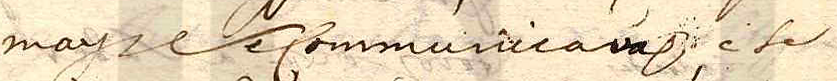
mays Se Communicavaõ, e se
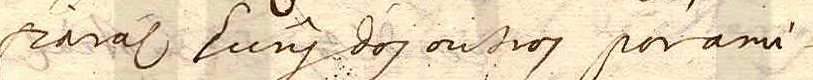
fiaraõ hun̄s dos outros por ami
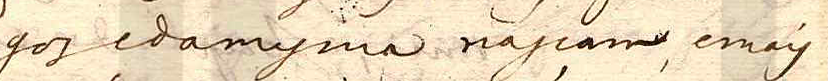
gos, e da mesma nasçam, e mais
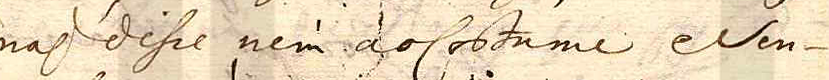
naõ disse, nem ao Costume, e Sen
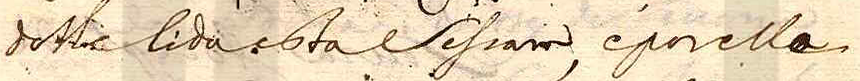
dolhe lida esta Sessam, e por ella
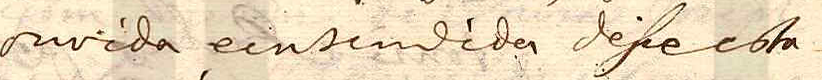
ouvida e intendida disse esta
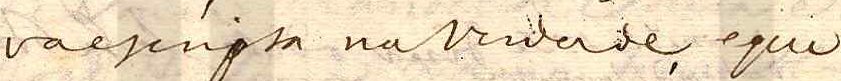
va escripta na verdade, e que
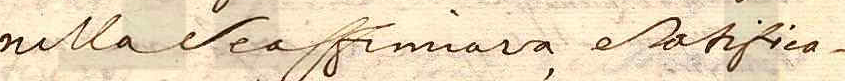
nella Se affirmava, e ratifica
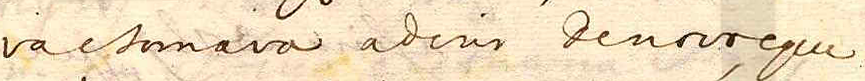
va e tornava a dizer de novo, e que
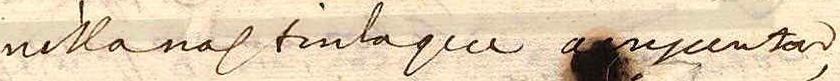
nella naõ tinha que acrescentar,
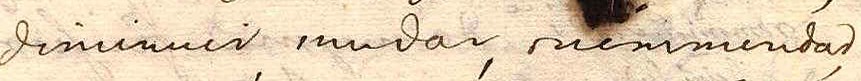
diminuir, mudar, ou emmendar,
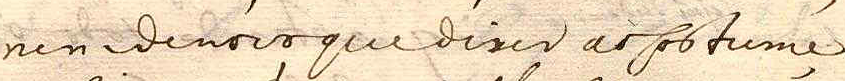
nem de novo, que dizer ao Costume,
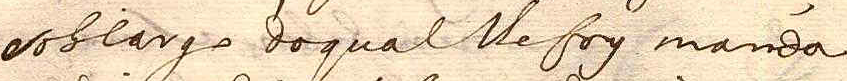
sob cargo do qual lhe foy manda
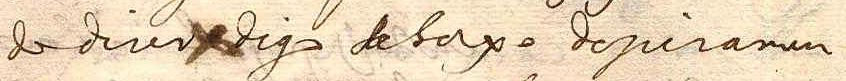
do dizer digo de baixo de juramen
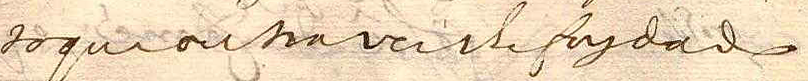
to que outra vez lhe foy dado
